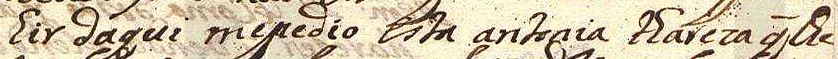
hir daqui me pedio esta antonia thareza q̄ lhe
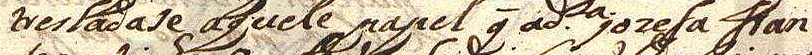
tresladase aquele papel q̄ a d.ta jozefa fran
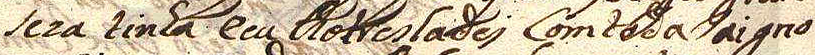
seza tinha e eu lho tresladej Com toda a igno
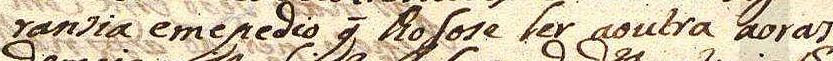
ransia e me pedio q̄ lhe fose ler a outra a oras
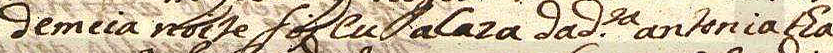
de meia noite foj eu a Caza da d.ta antonia tha
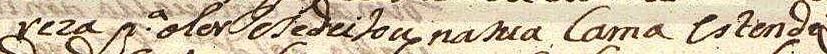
reza p.a o ler e se deitou na sua Cama estendi
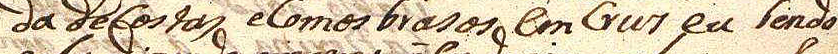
da de costas e Com os brasos em Crus eu lendo
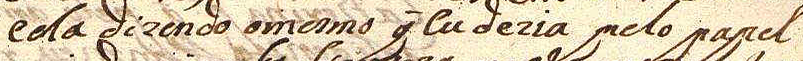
e ela dizendo o mesmo q̄ eu dezia pelo papel
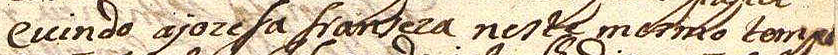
e uindo a jozefa franseza neste mesmo tempo
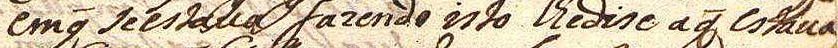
em q̄ se estaua fazendo isto lhe dise a q̄ estaua
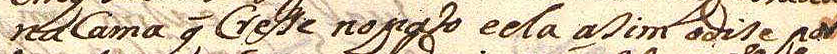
na Cama q̄ Cresse no pato e ela asim o dise por
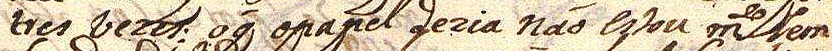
tres vezes: o q̄ o papel dezia naõ estou m.to lem
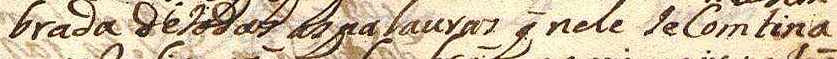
brada de todas as palauras q̄ nele se Comtina
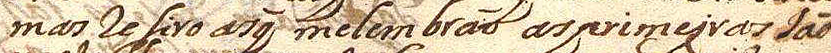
mas Refiro as q̄ me lembraõ as primejras saõ
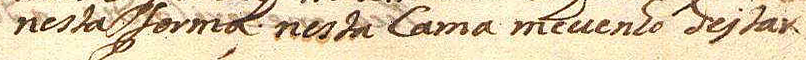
nesta forma; nesta Cama me uendo dejtar
